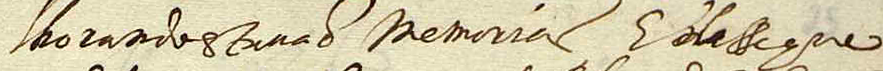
lhorando estauaõ memorias E disse que
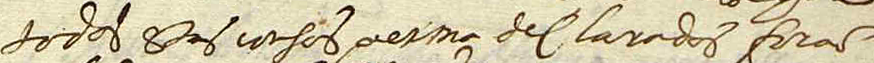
todas estas cousas acima deClaradas foraõ
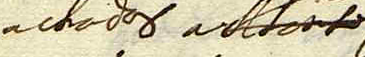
achadas a Alonso
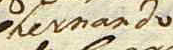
hernando
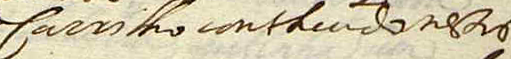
Carrilho contheudo nestes
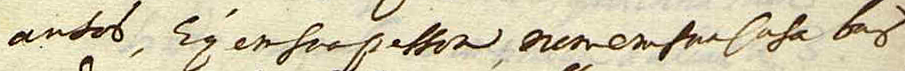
autos, E q̄ em sua pessoa, nem em sua Casa bus
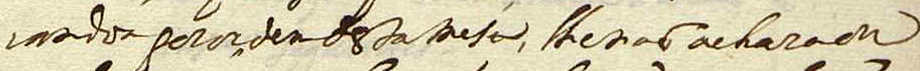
candoa por ordem desta mesa, lhe naõ achara ou
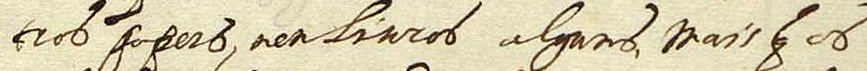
tros papeis, nem liuros alguns mais q̄ os
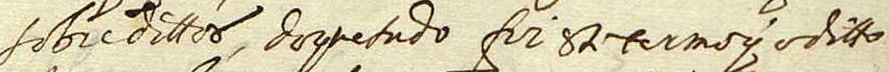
sobredittos, do que tudo fiz este termo q̄ o ditto
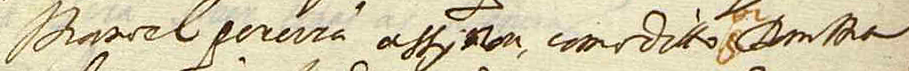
Manoel pereira assynou com o ditto sor Dom Ma
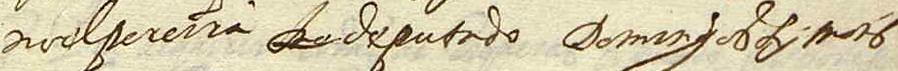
noel pereira Do deputado Domingos symois
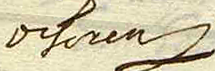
o escreuj
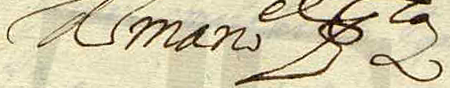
dō manoel pra
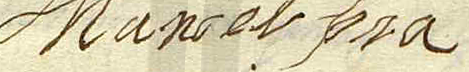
Manoel pra
